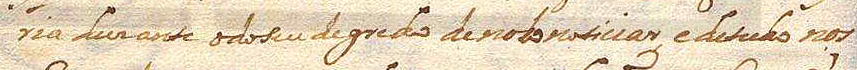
ria durante o do seu degredo de novo noticiar, e de tudo nos
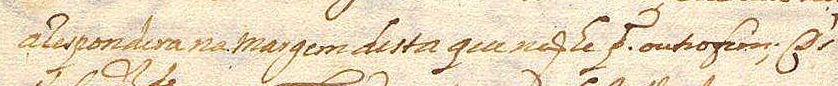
aRespondera na margem desta que naõ he p.a outro fim; Ds̄
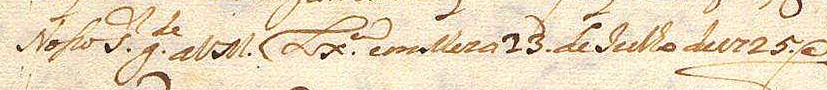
Nosso s.or g.de a VM. Lx.a em Meza 23. de Iulho de 1725. ā
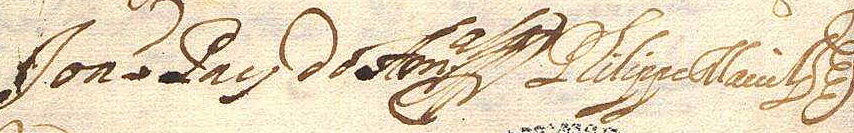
Joaõ Paes do Amal Philippe Maciel
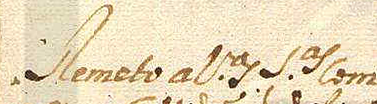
Remeto a V.as S.as Com
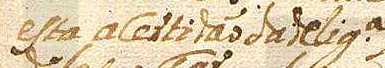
esta a Certidaõ da delig.a
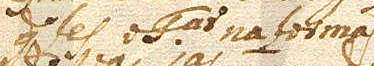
q̄ fes o F.ar na forma
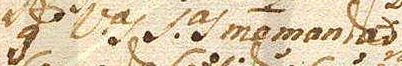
q̄ V.as s.as me mandaõ
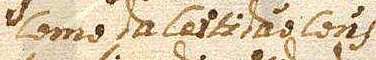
Como da Certidaõ con̄s
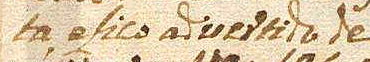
ta, e fico aduertido de
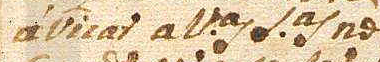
avizar a V.as s.as no
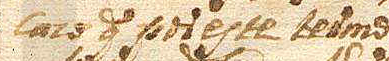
cazo q̄ por este termo
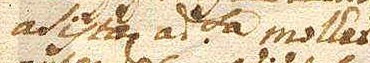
asista a d.ta molher
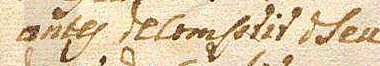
antes de comferir o seu
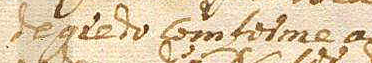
degredo Comforme a
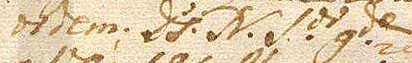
ordem. Ds̄. N. s.or g.de
